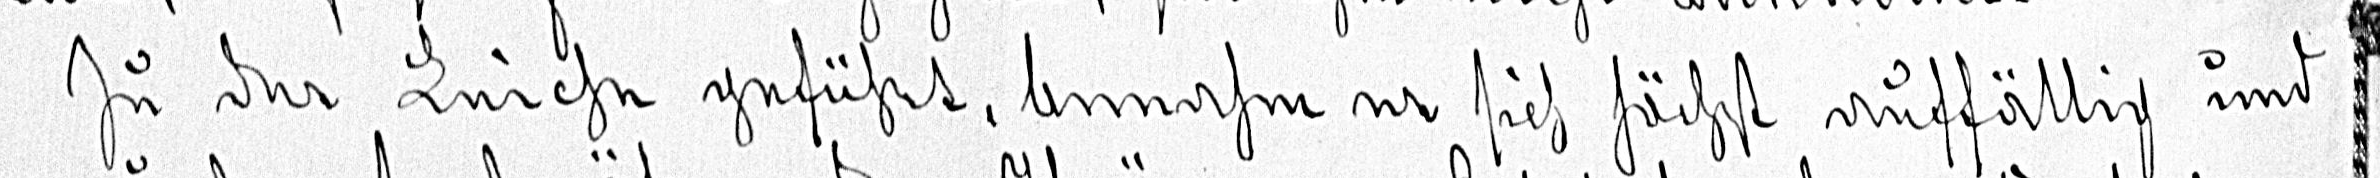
Zu der Leiche geführt, benahm er sich höchst auffällig und
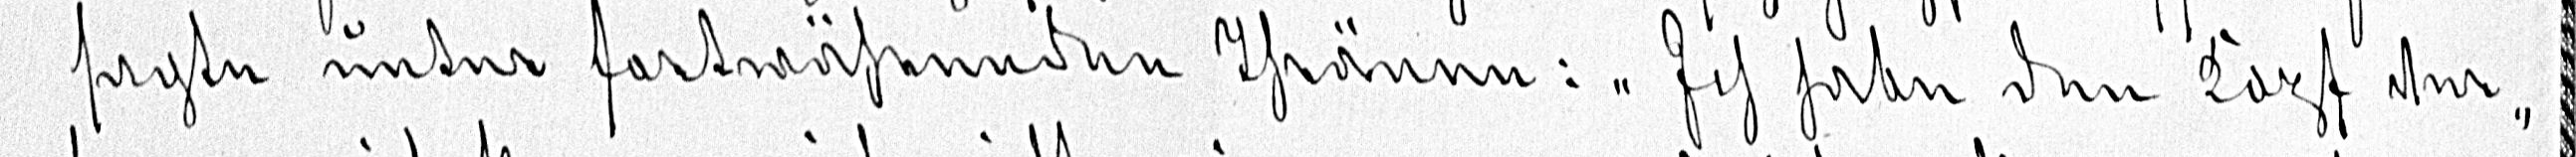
sagte unter fortwährenden Thränen: „Ich habe den Kopf ver¬
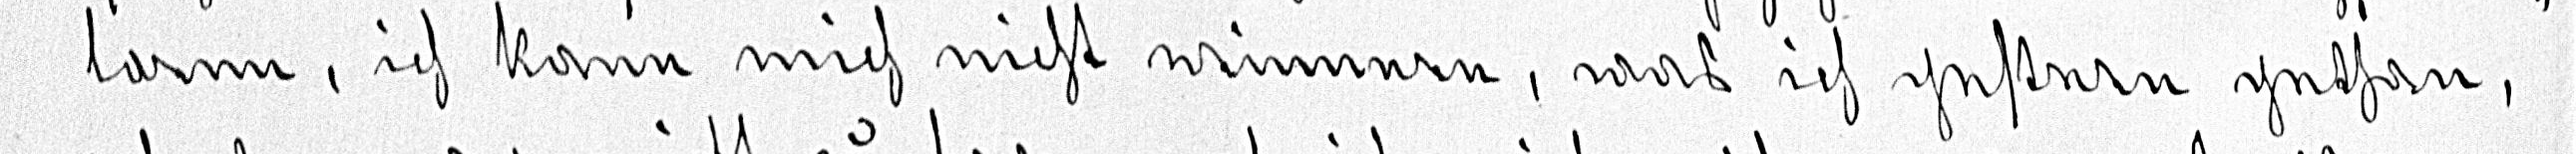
loren, ich kann mich nicht erinnern, was ich gestern gethan,
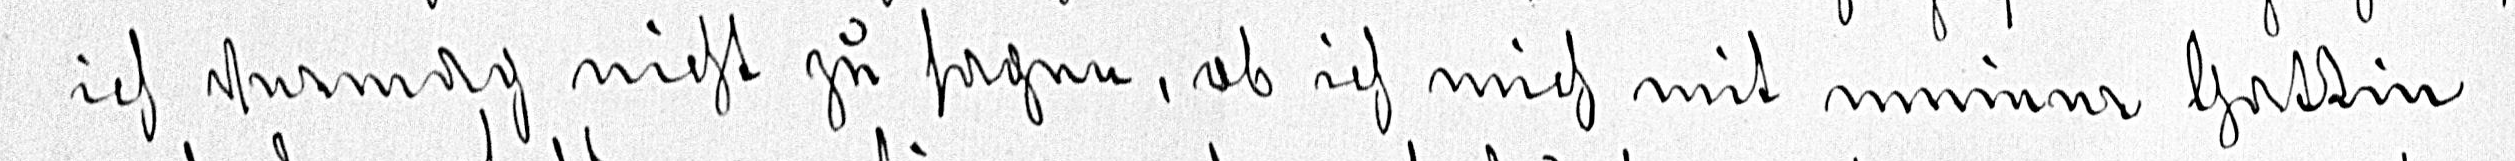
ich vermag nicht zu sagen, ob ich mich mit meiner Gattin
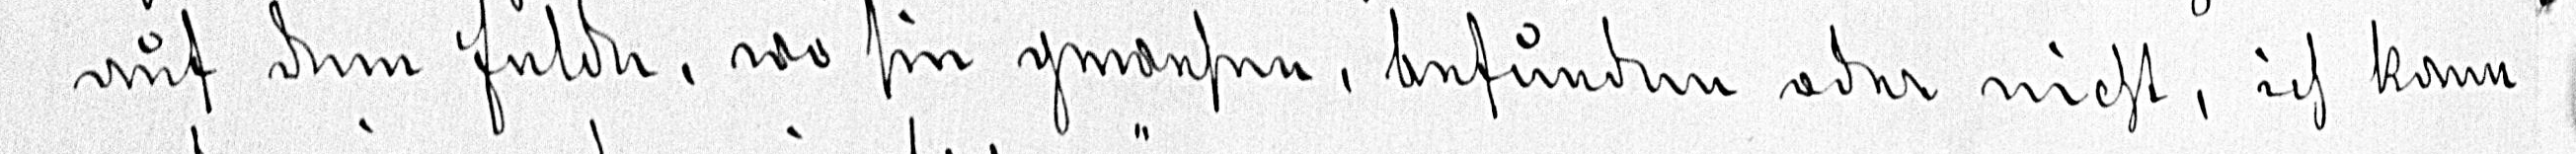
auf dem Felde, wo sie gewesen, befunden oder nicht, ich kann
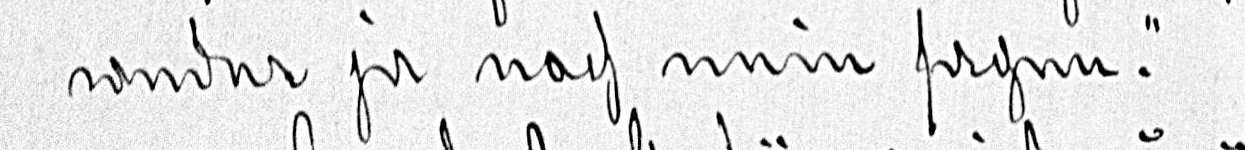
weder ja noch nein sagen.“
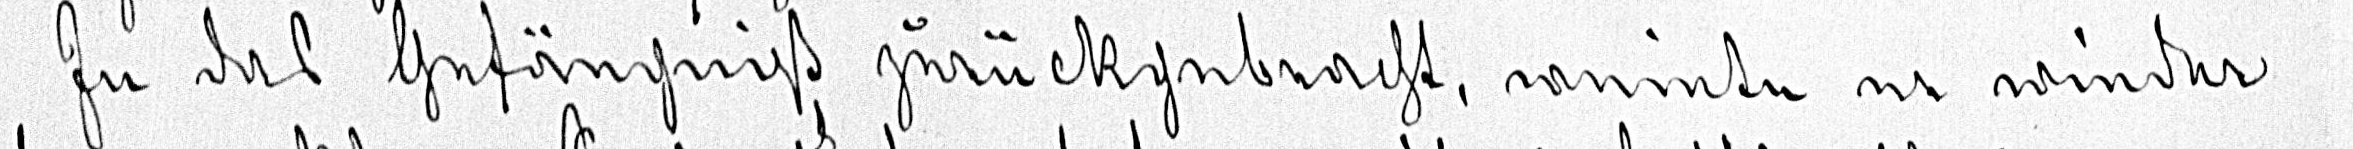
In das Gefängniß zurückgebracht, weinte er wieder
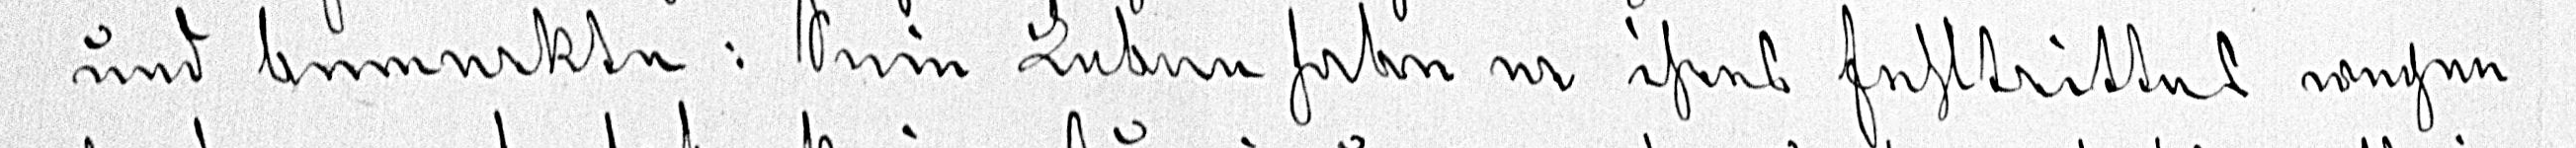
und bemerkte: Sein Leben habe er ihres Fehltrittes wegen
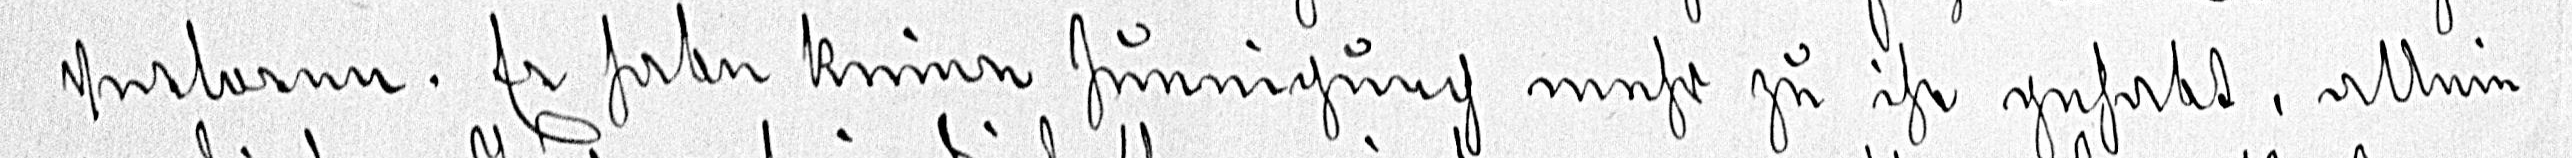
verloren. Er habe keine Zuneigung mehr zu ihr gehabt, allein
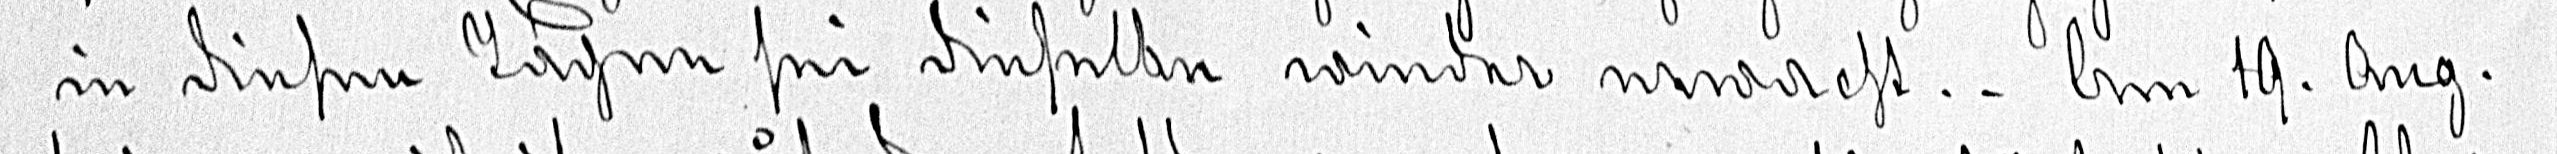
in diesen Tagen sei dieselbe wieder erwacht.- Am 19. Aug.
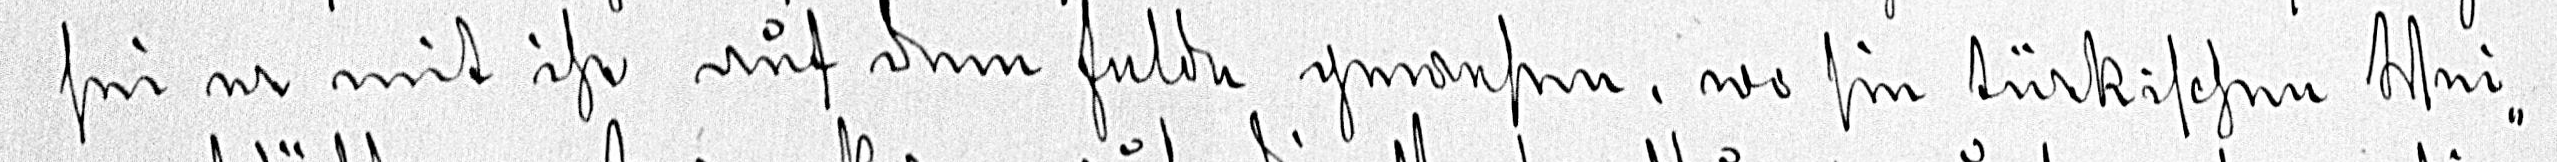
sei er mit ihr auf dem Felde gewesen, wo sie türkischen Wei¬
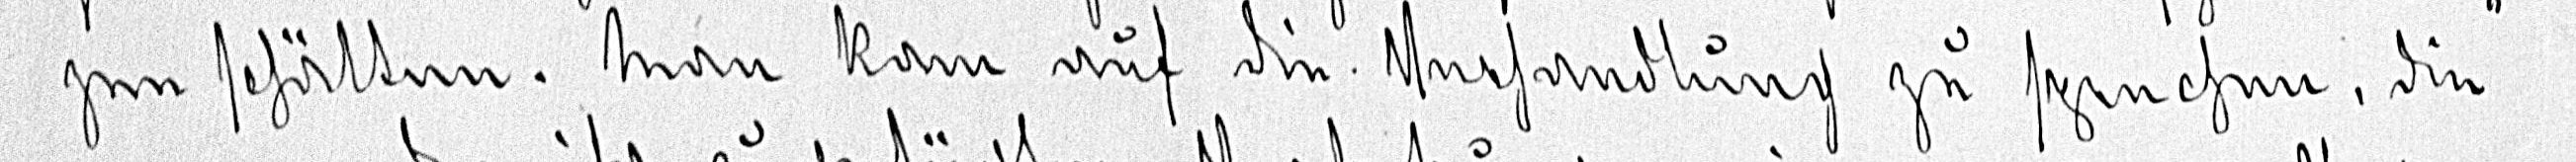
zen schälten. Man kam auf die Verhandlung zu sprechen, die
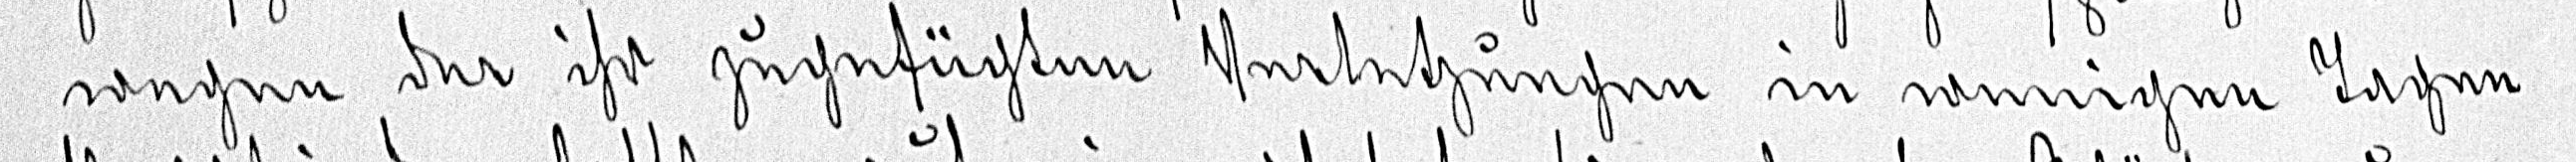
wegen der ihr zugefügten Verletzungen in wenigen Tagen
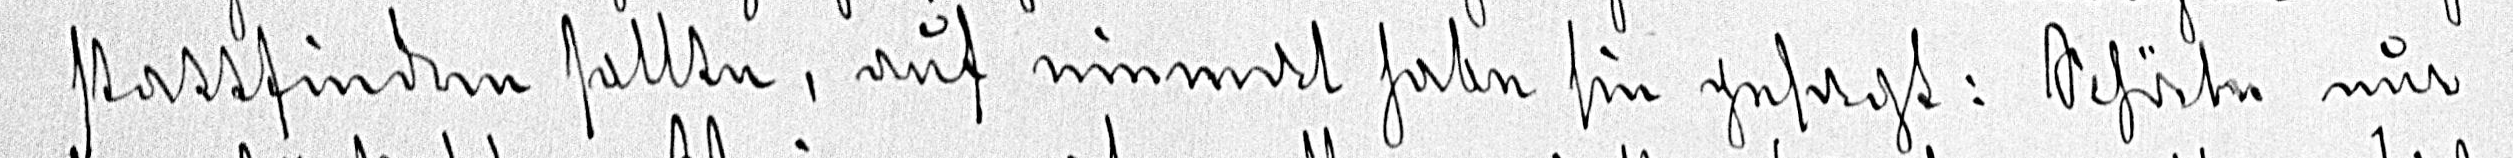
stattfinden sollte, auf einmal habe sie gesagt: Schälet nur
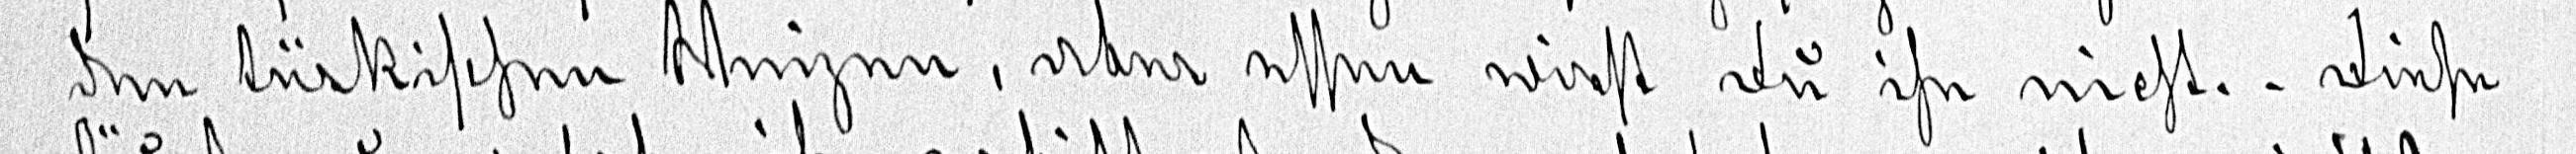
den türkischen Weizen, aber essen wirst Du ihn nicht.- Diese
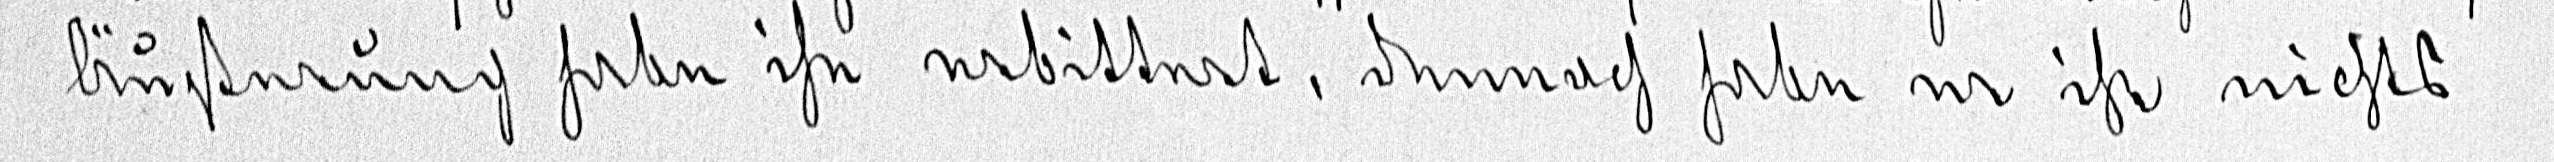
Äußerung habe ihn erbittert, dennoch habe er ihr nichts
